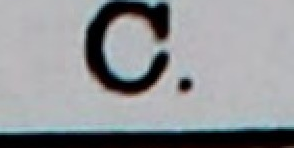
C.
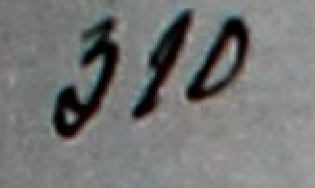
310
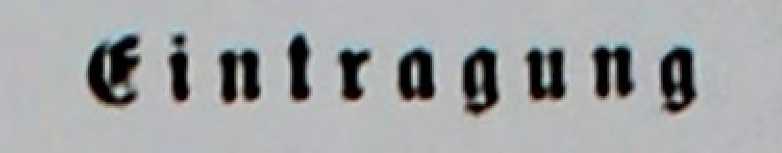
Eintragung
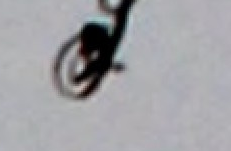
S
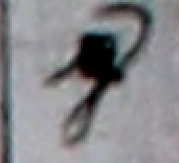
G
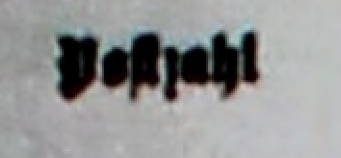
Postzahl
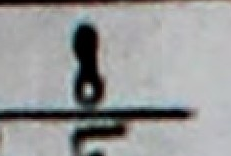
8
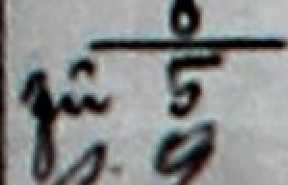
zu 5
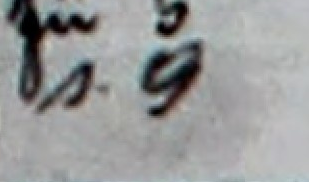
s. 9
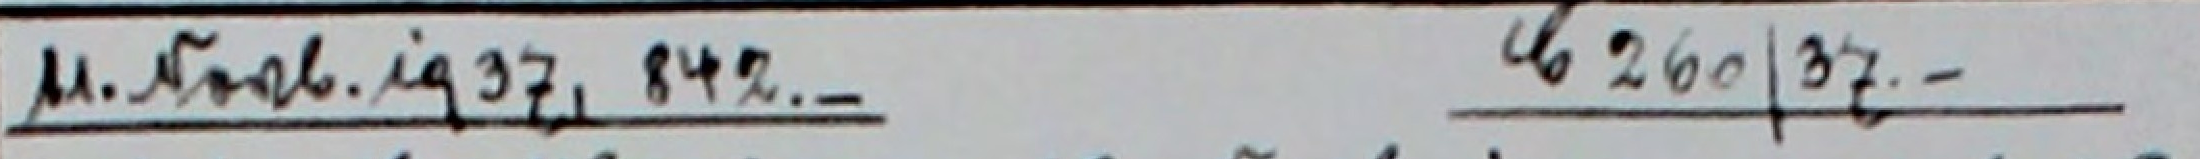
11. Novb. 1937, 842.- C 260/37.-
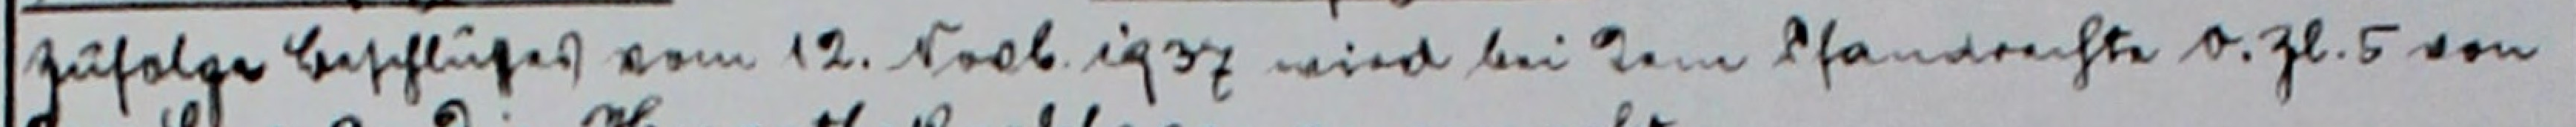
Zufolge Beschlusses vom 12. Novb. 1937 wird bei dem Pfandrechte v. Zl. 5 von
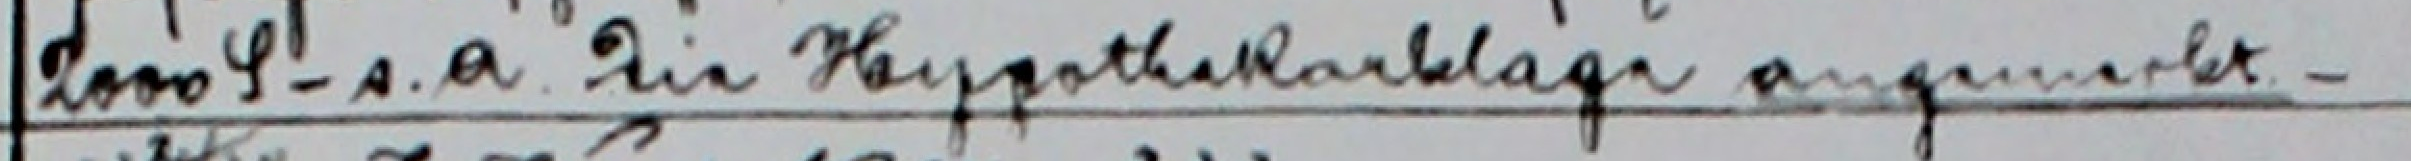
200 S - s.a. die Hypothekarklage angemerkt.-
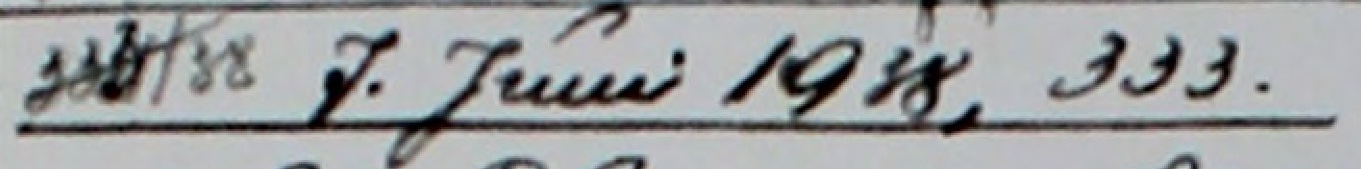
333/38 7. Juni 1938, 333.
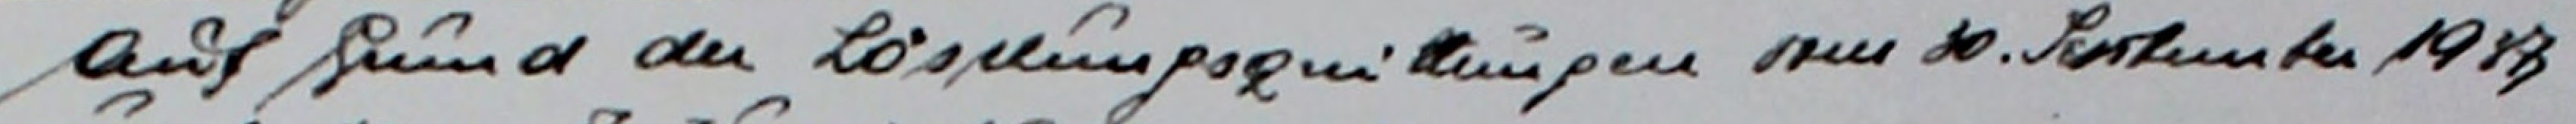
Auf Grund der Löschungsquittungen vom 30. September 1937
